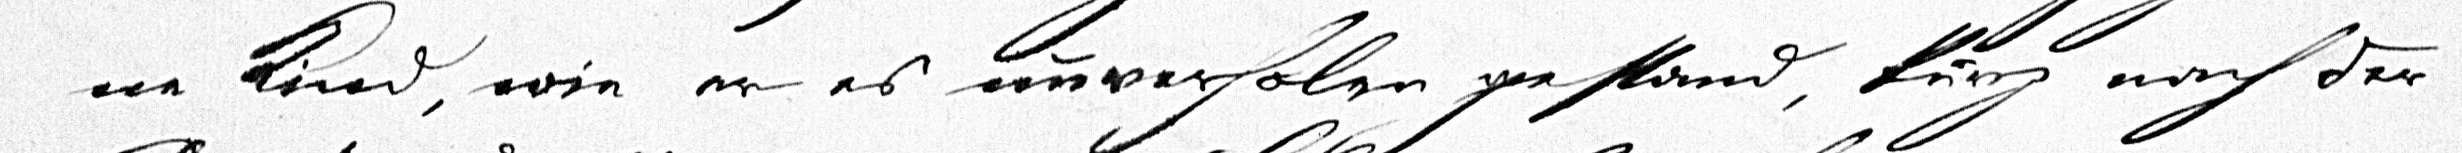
ne Kind, wie er es unverxxlen gestand, kurz nach der
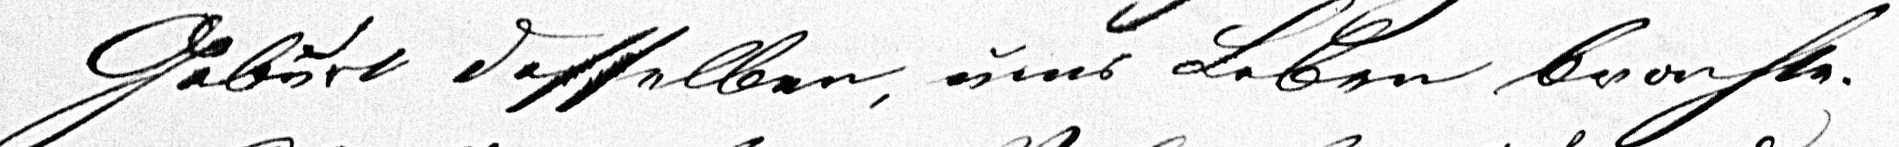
Geburt desselben, ums Leben brachte.
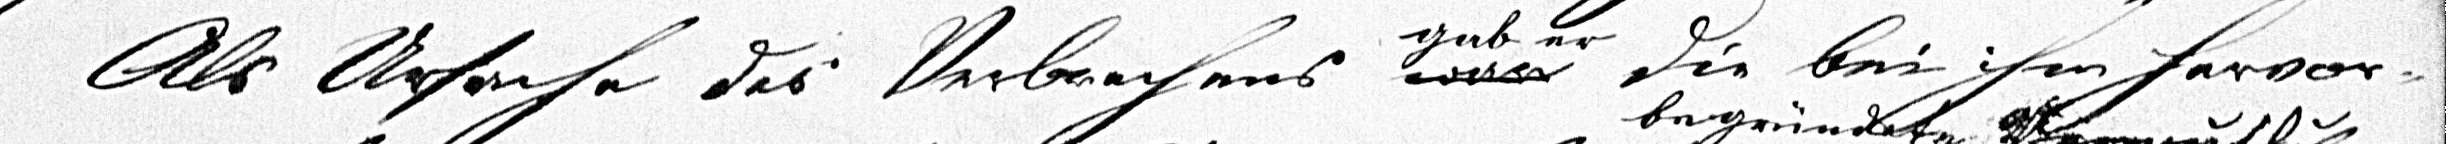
Als Ursache des Verbrechens gab er die bei ihm hervor¬
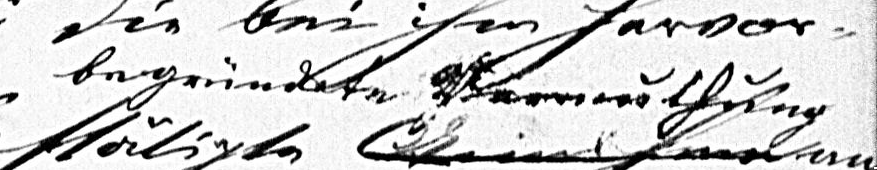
begründete Vermuthung
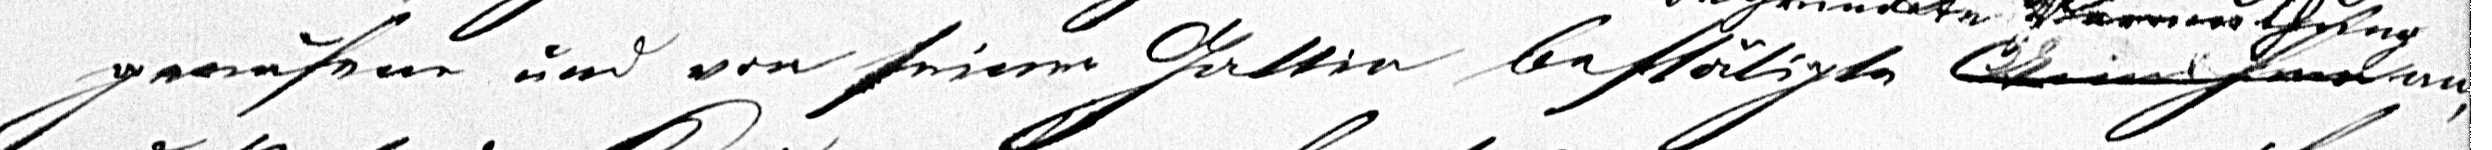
gerufene und von seiner Gattin bestätigte an,
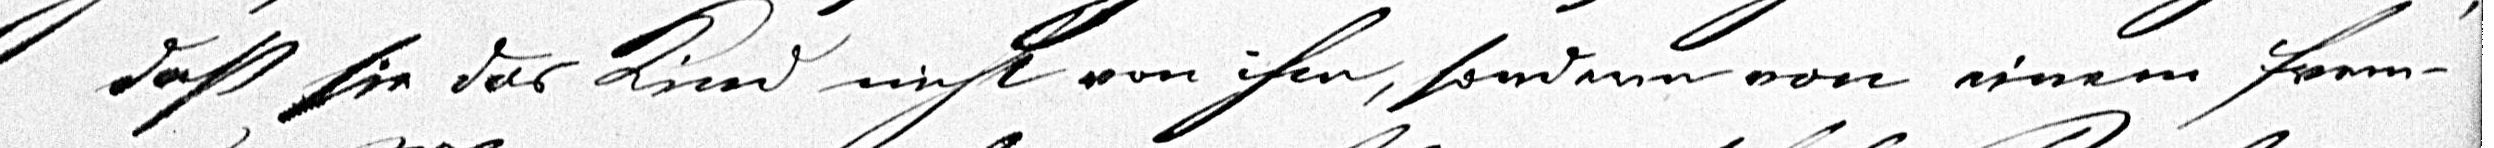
daß sie das Kind nicht von ihm, sondern von einem frem¬
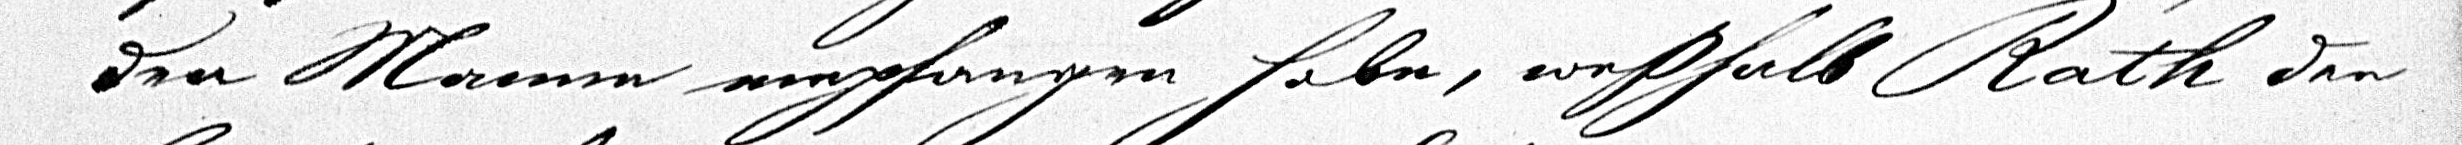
den Manne empfangen habe, weßhalb Rath den
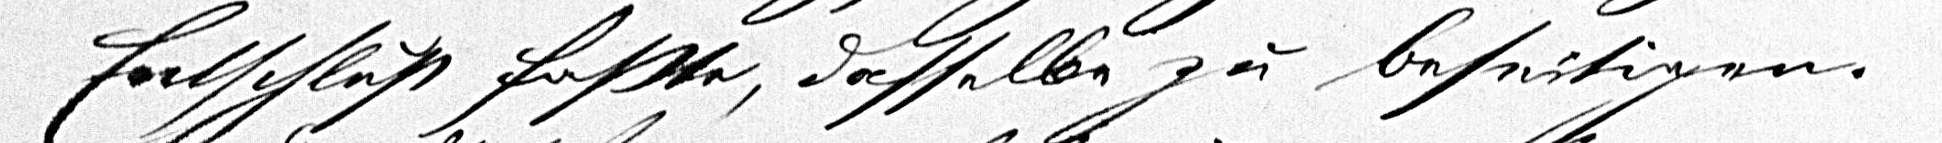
Entschluß faßte, dasselbe zu beseitigen.
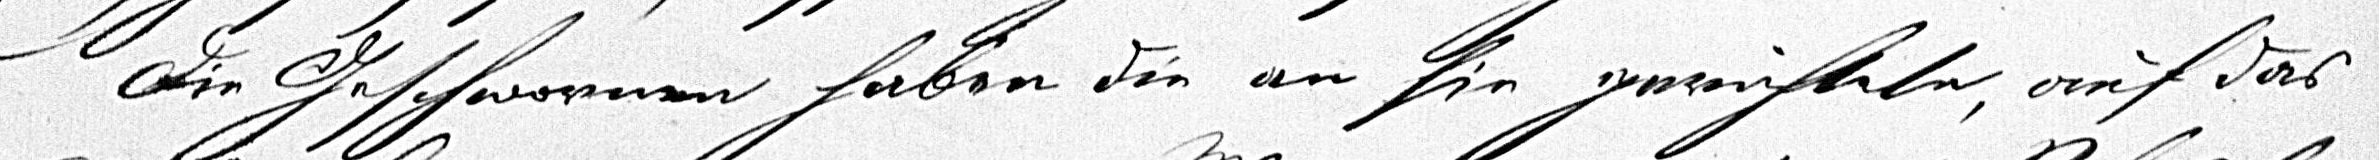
Die Geschwornen haben die an sie gerichtete, auf das
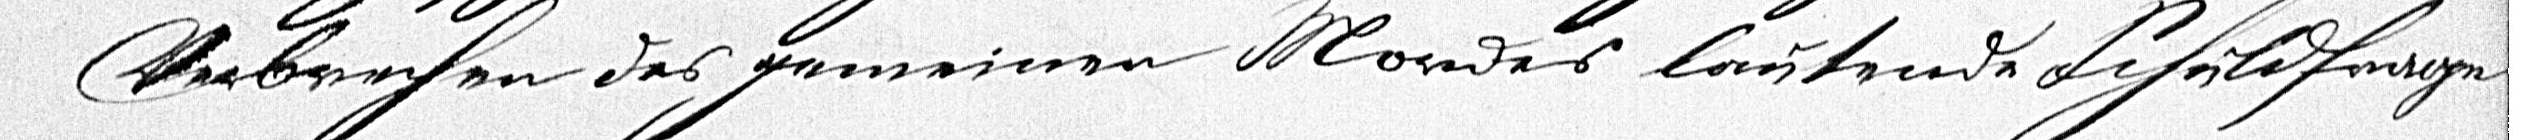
Verbrechen des gemeinen Mordes lautende Schuldfrage
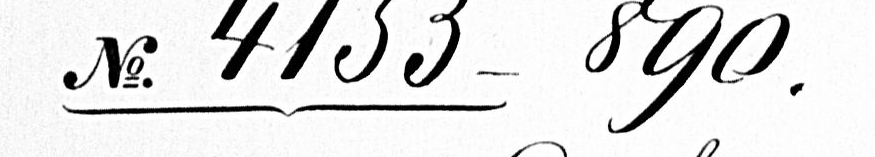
N° 4153-890.
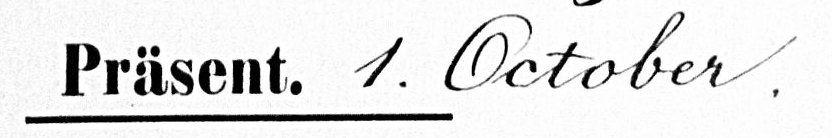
Präsent. 1. October.
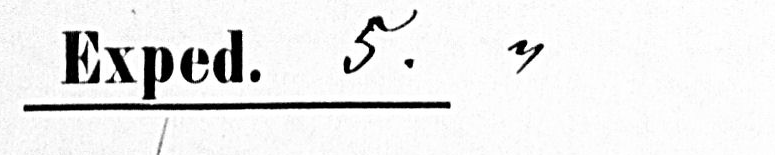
Exped. 5. October.
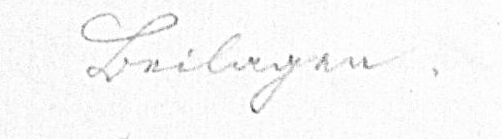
Beilagen.
